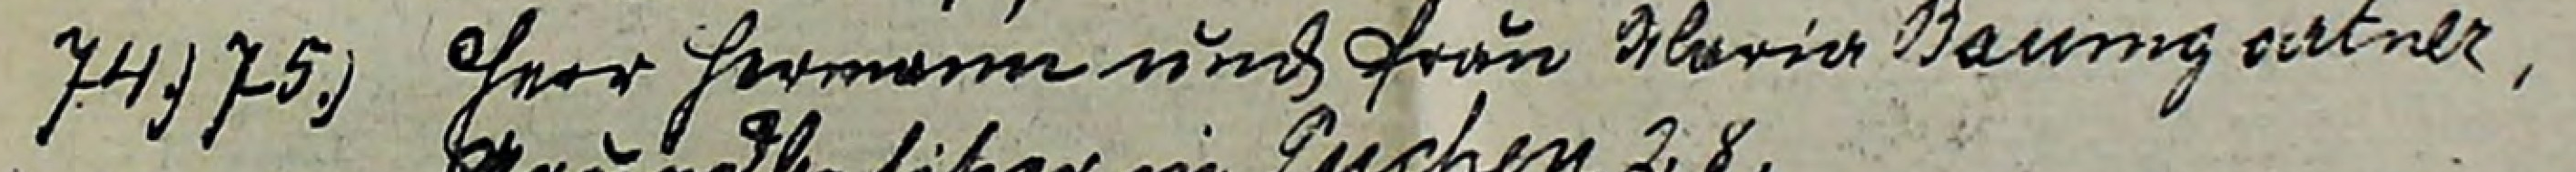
74.) 75.) Herr Hermann und Frau Maria Baumgartner,
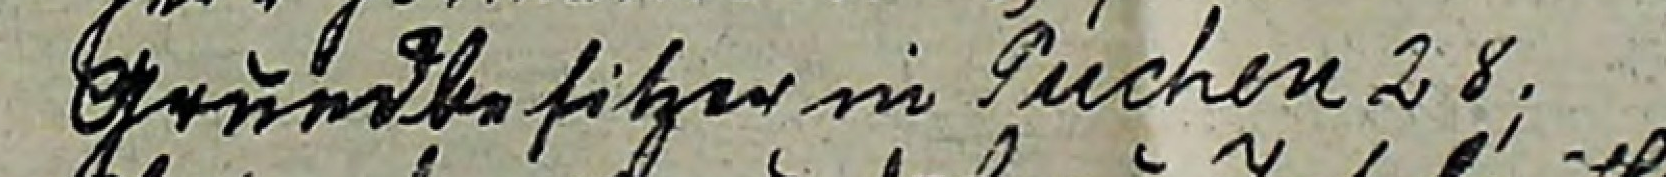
Grundbesitzer in Puchen 28;
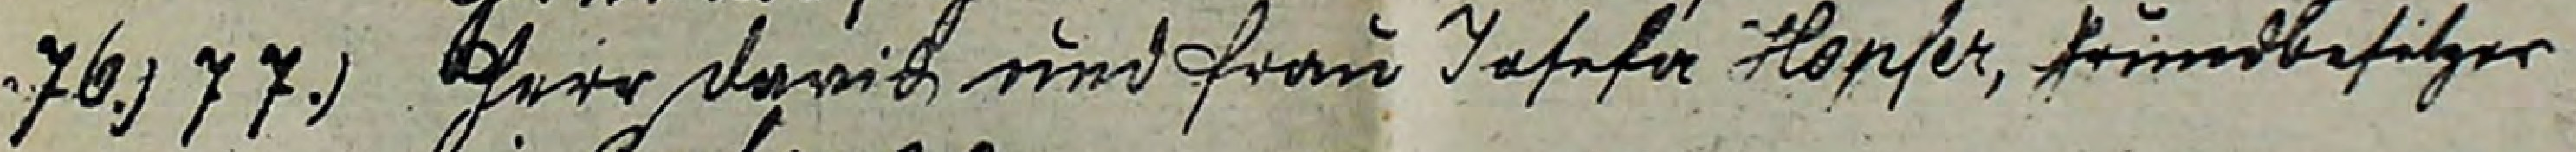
76.) 77.) Herr David und Frau Josefa Hopfer, Grundbesitzer
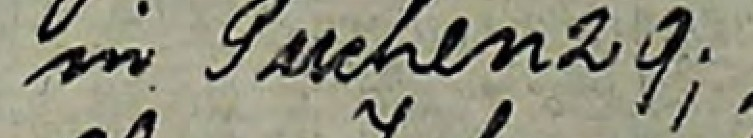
in Puchen 29;
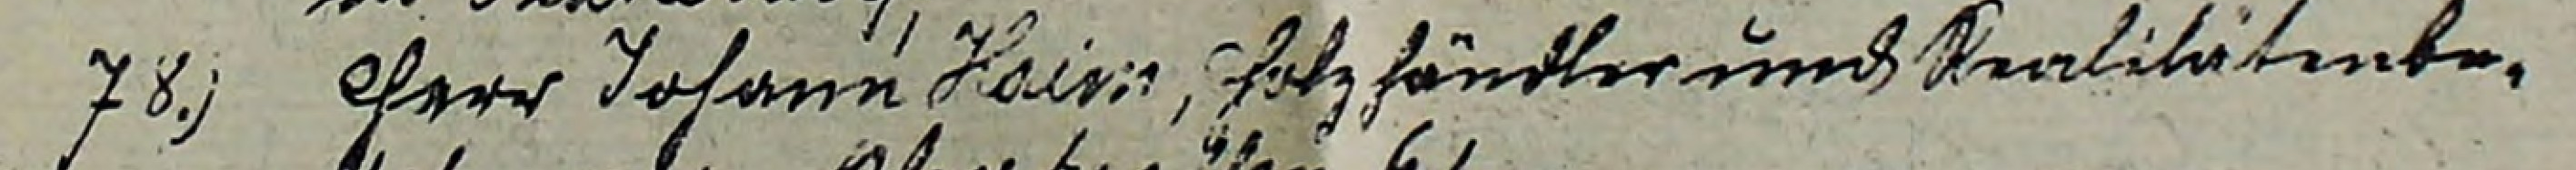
78.) Herr Johann Haim, Holzhändler und Realitätenbe„
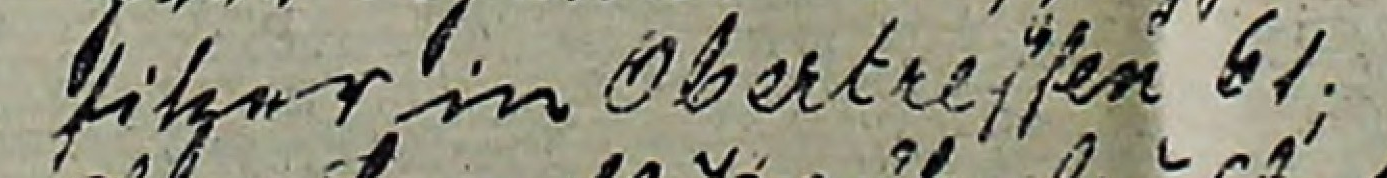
sitzer in Obertreffen 61;
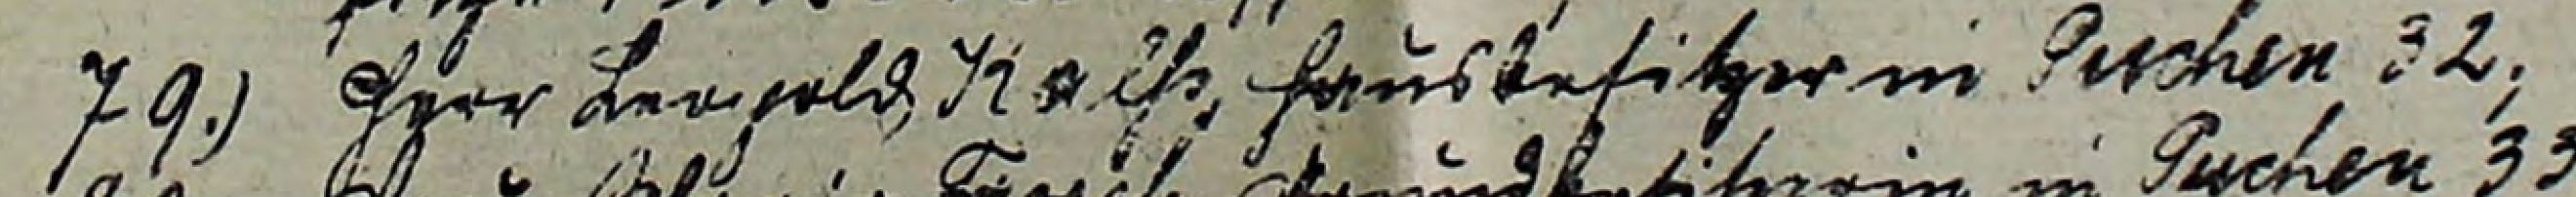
79.) Herr Leopold Kalhs, Hausbesitzer in Puchen 32;
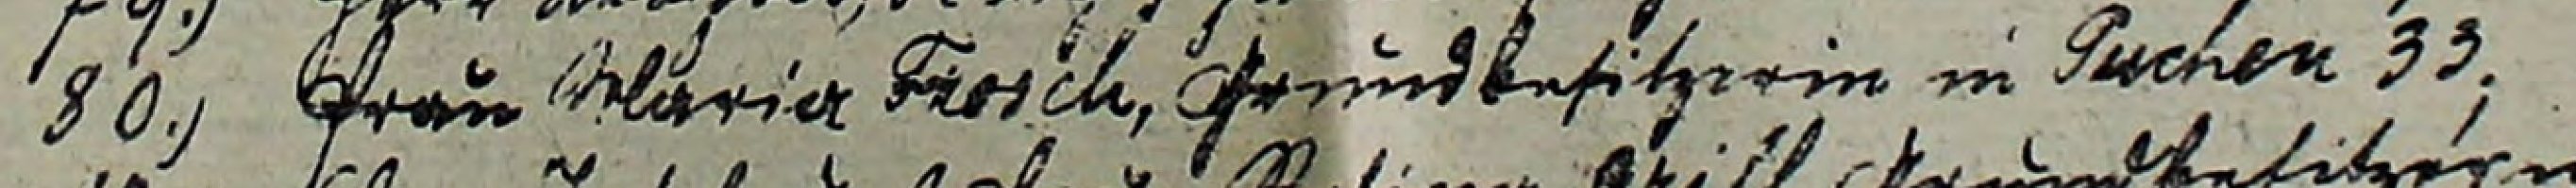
80.) Frau Maria Frosch, Grundbesitzer in Puchen 33;
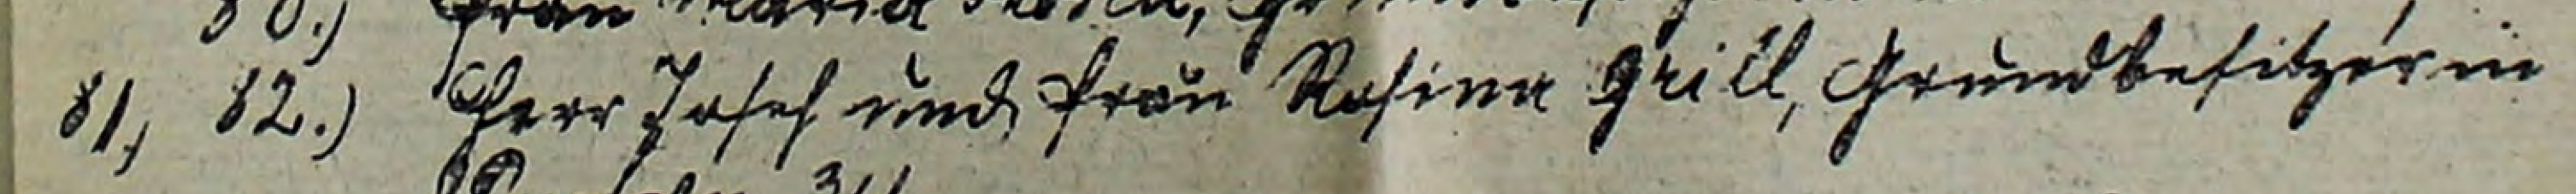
81.) 82.) Herr Josef und Frau Rosina Grill, Grundbesitzer in
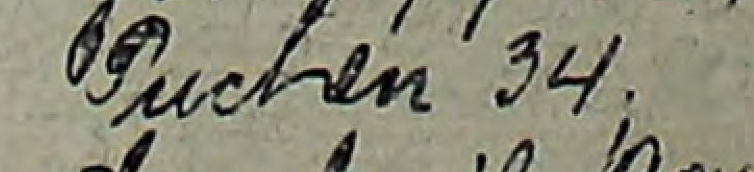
Puchen 34;
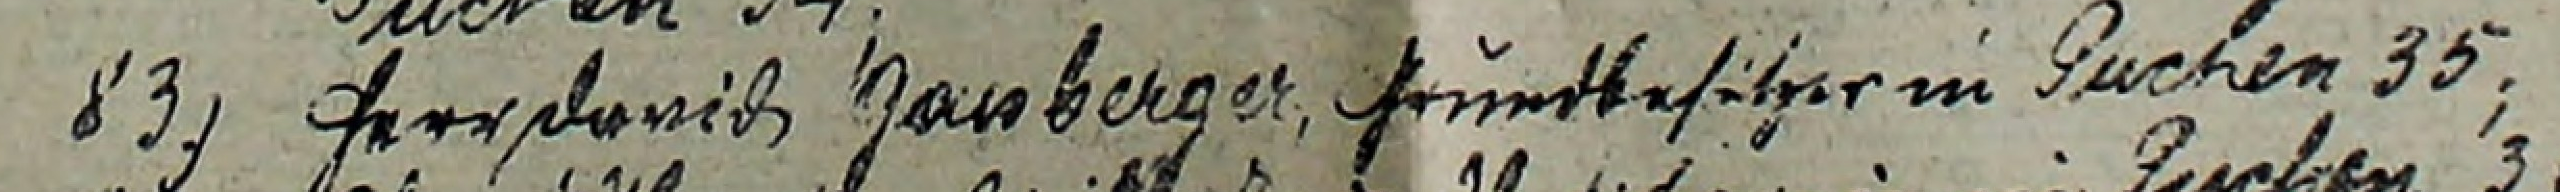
83.) Herr David Gaisberger, Grundbesitzer in Puchen 35;
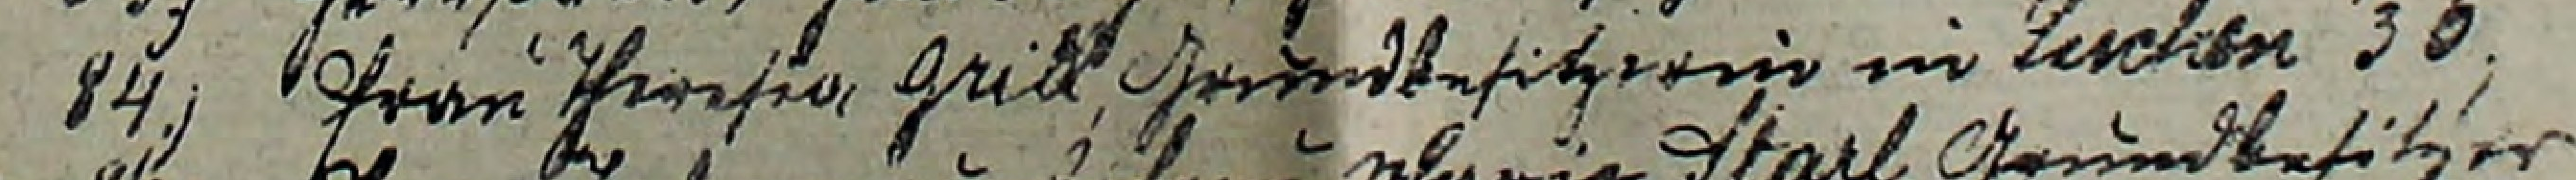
84.) Frau Theresia Grill, Grundbesitzerin in Puchen 30;
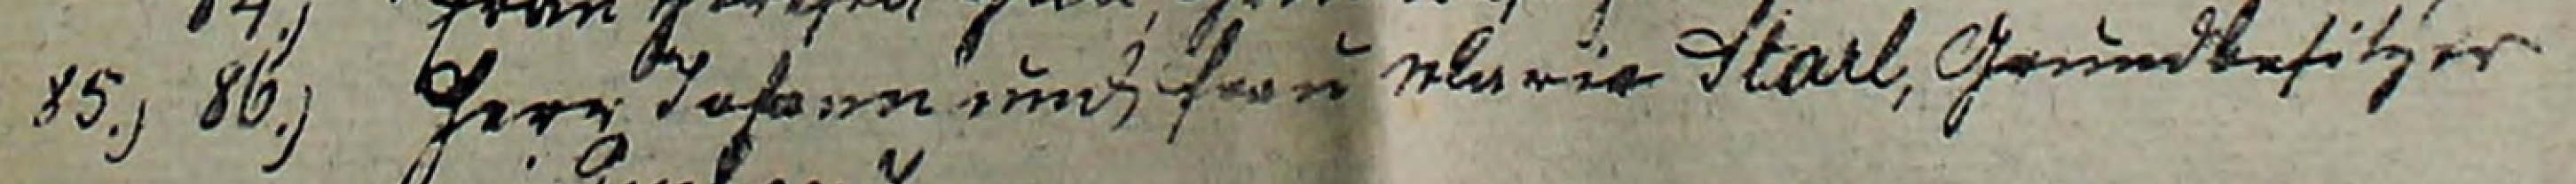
85.) 86.) Herr Johann und Frau Maria Starl, Grundbesitzer
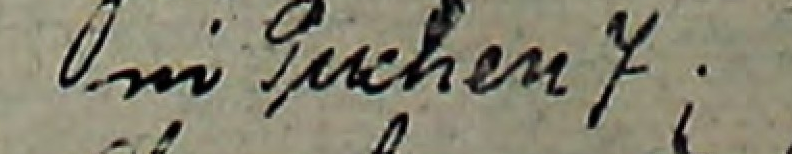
in Puchen 7;
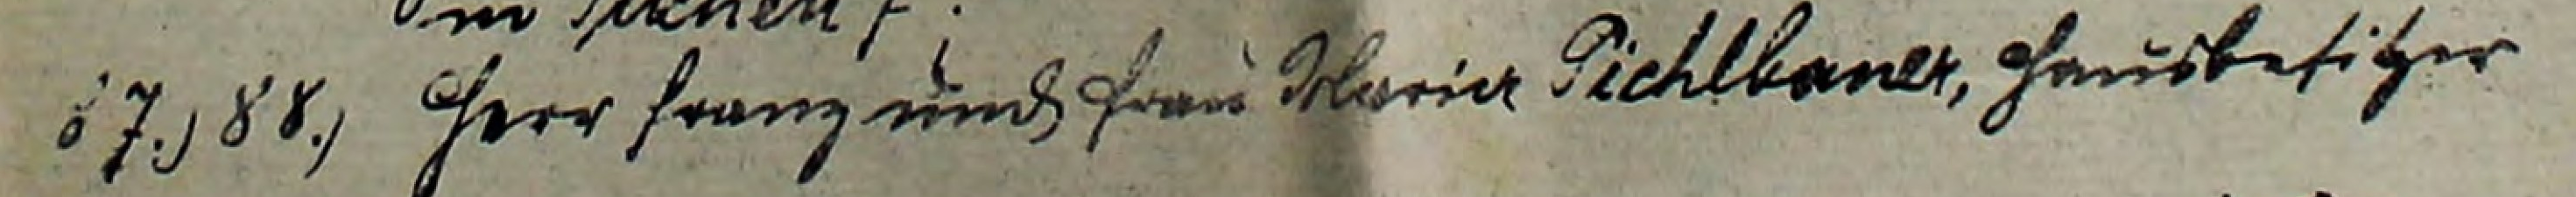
87.) 88.) Herr Franz und Frau Maria Pichlbaner, Hausbesitzer
